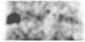一
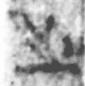之
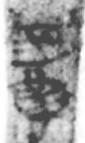○（緅）
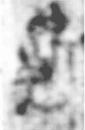○（鞍）
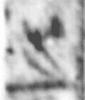之
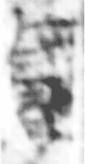○（緅）
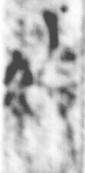紳（靷）
